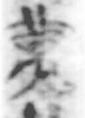黃
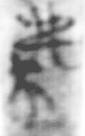柫
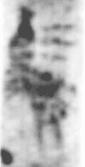馭（御）
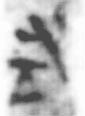○（右）
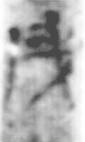彤
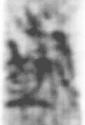○（旆）
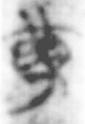革
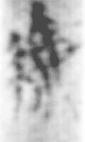綏
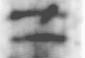二
